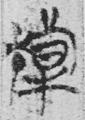○（幹）
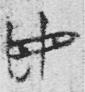母
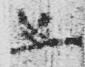之
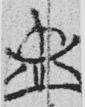蛊（蠱）
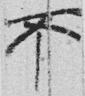不
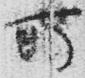可
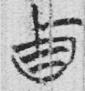貞
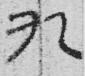九
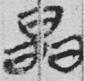晶
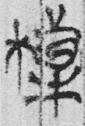○（幹）
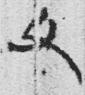父
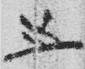之
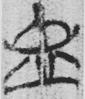蛊（蠱）
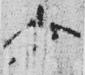少
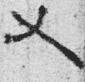又（有）
